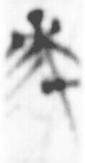桼
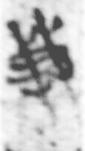兼
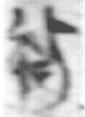紫
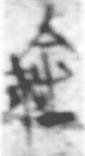○（錦）
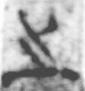之
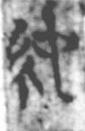純
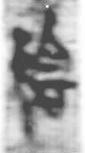○（組）
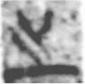之
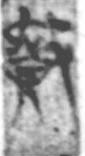○（綴）
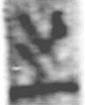之
